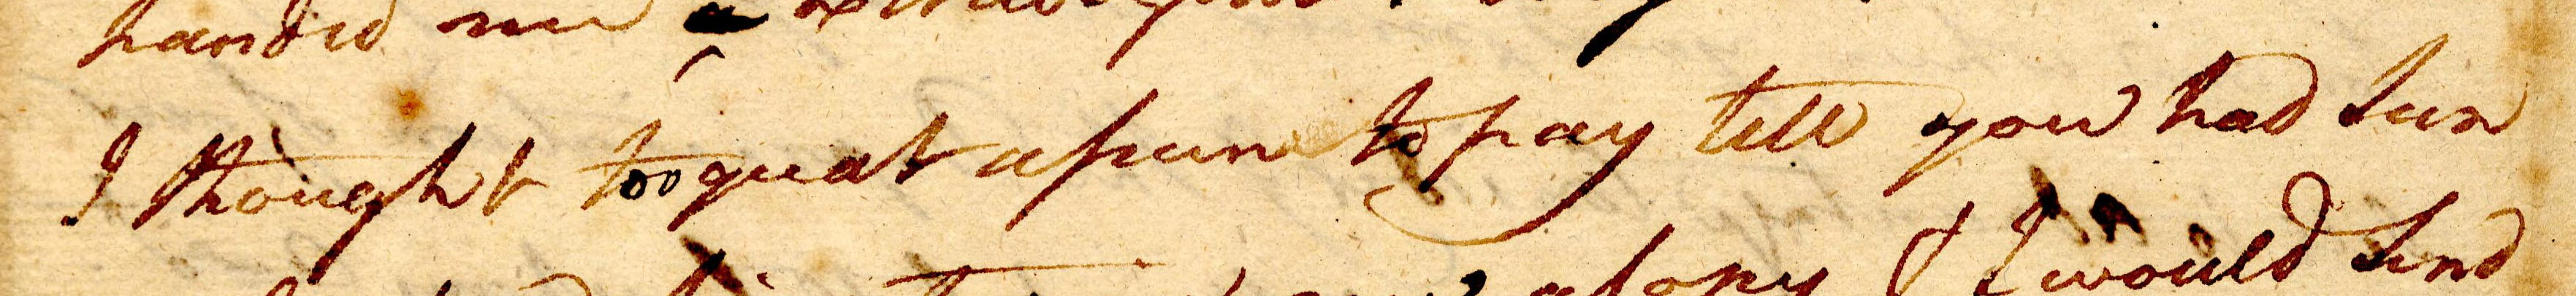I though too great a chance to pay till you had seen
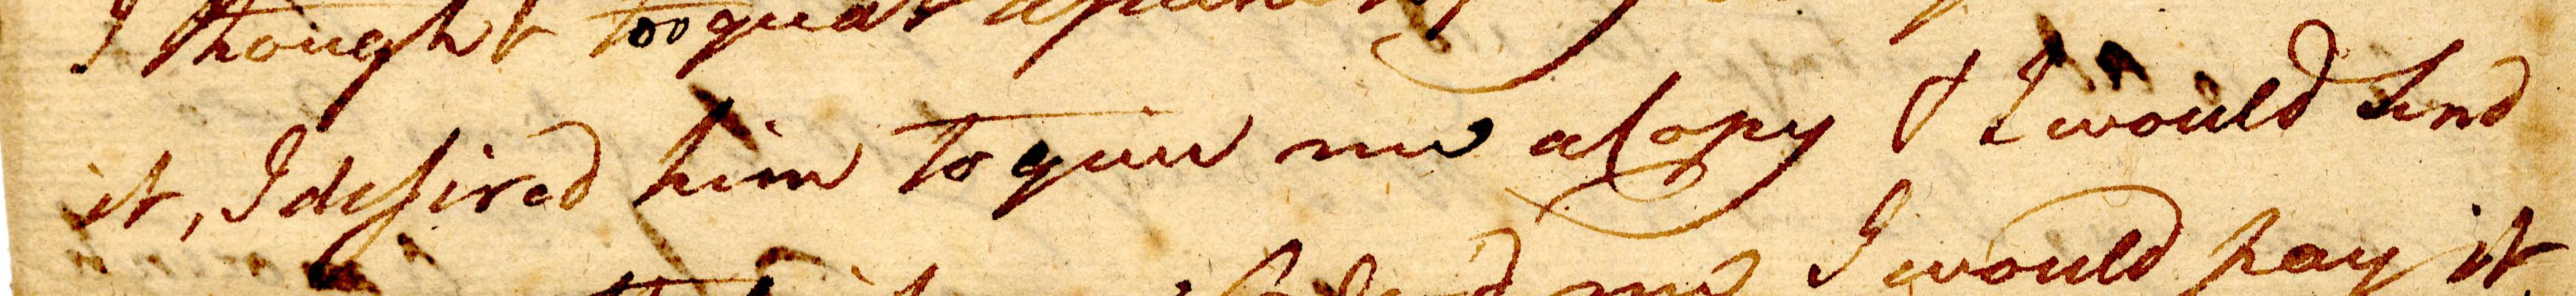it, I desired him to give me a Copy & I would send
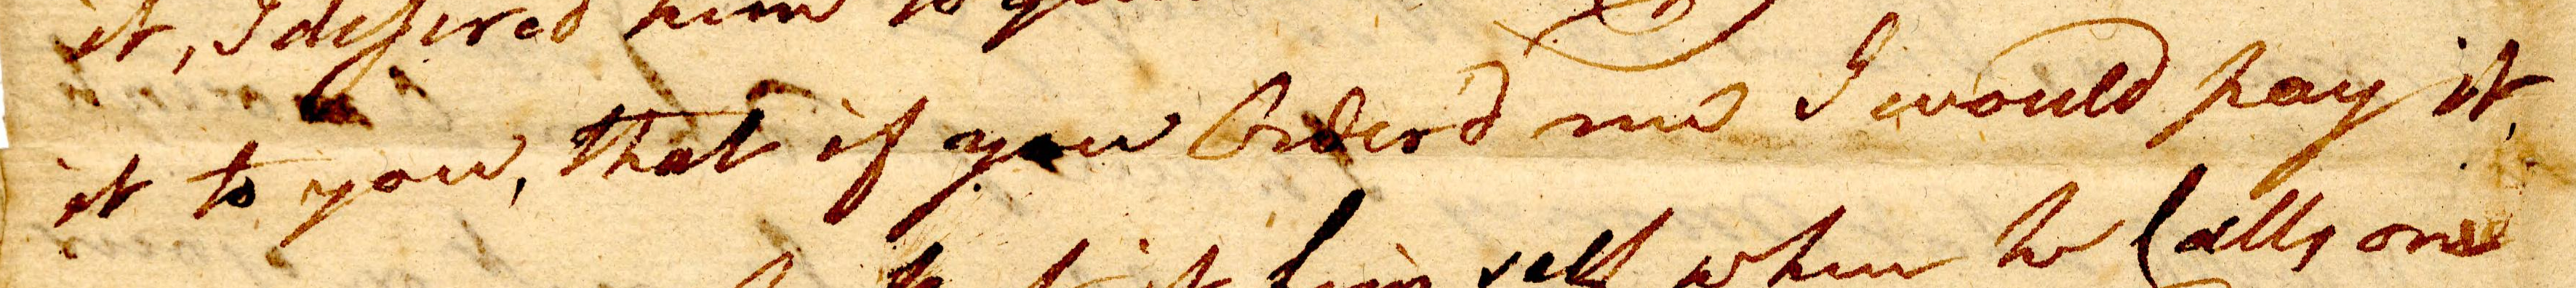it to you, that if you Order'd me I would pay it,
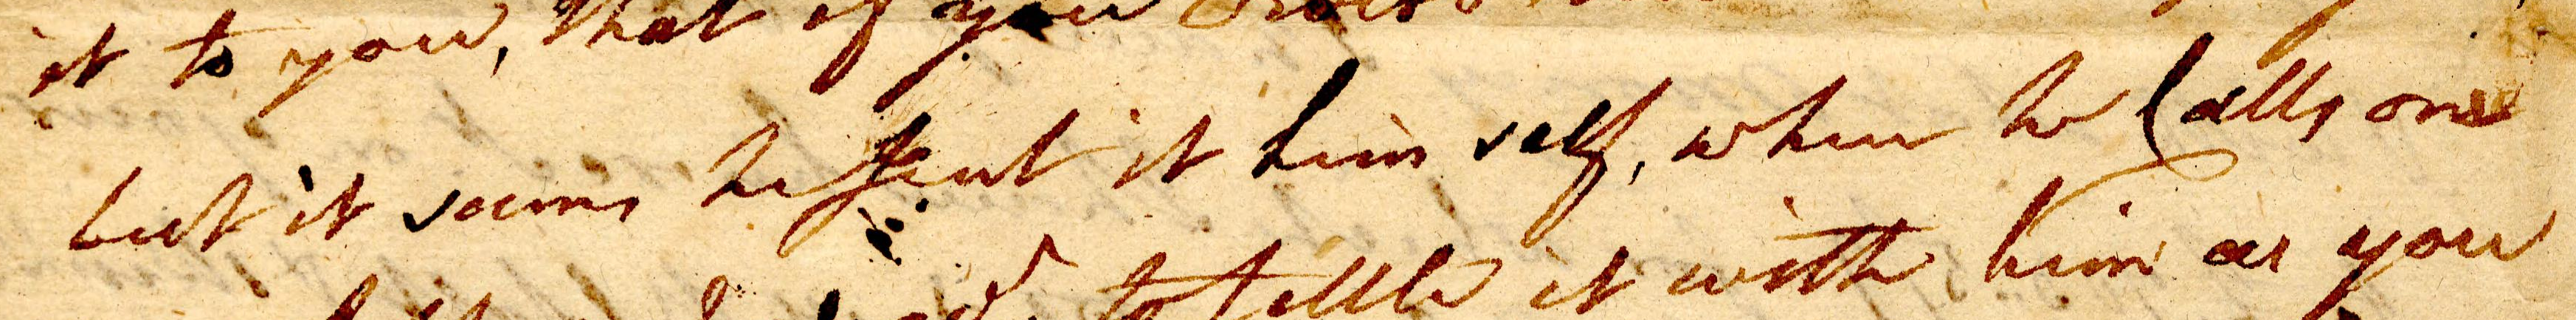but it seems he sent it him self, when he calls on
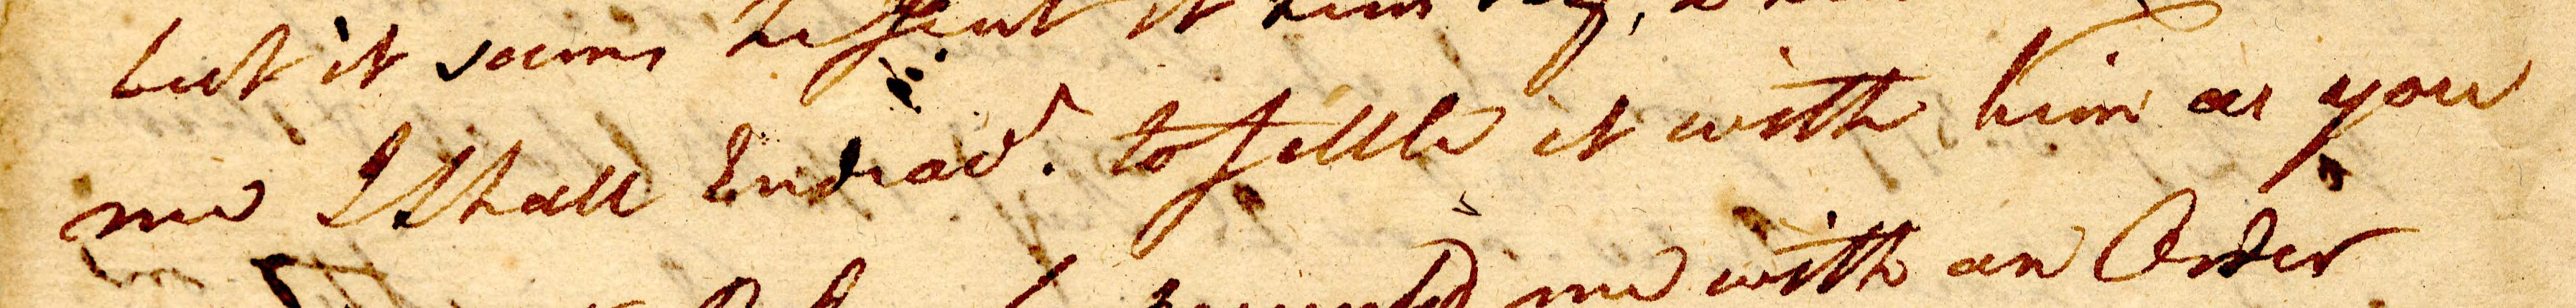me I shall Endeav^r. to settle it with him as you
